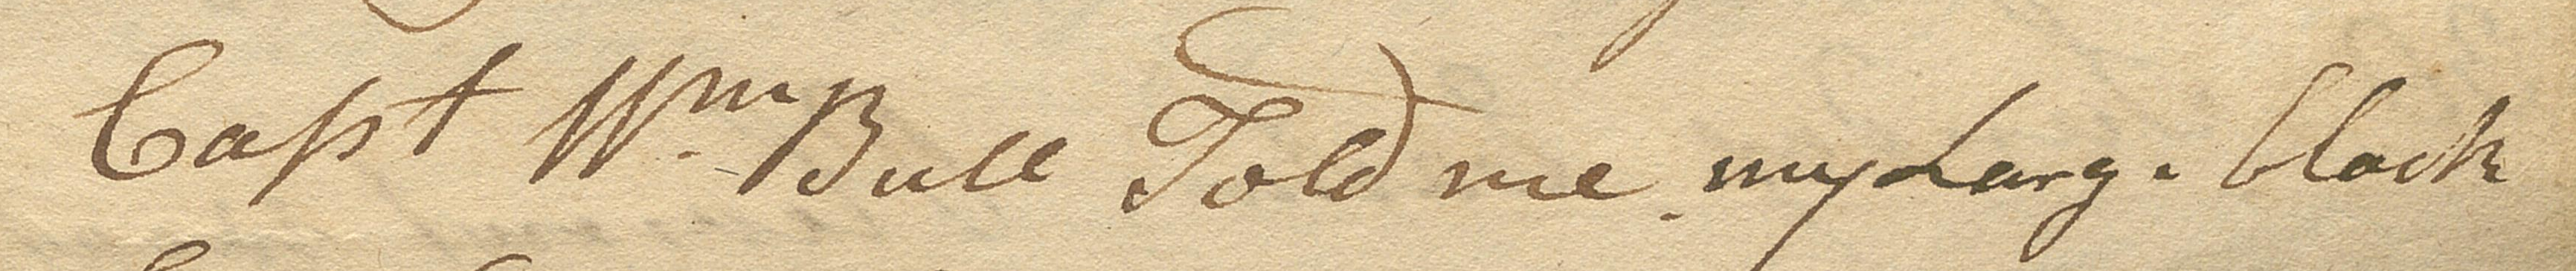Capt. W^m. Bull Told me my Large black
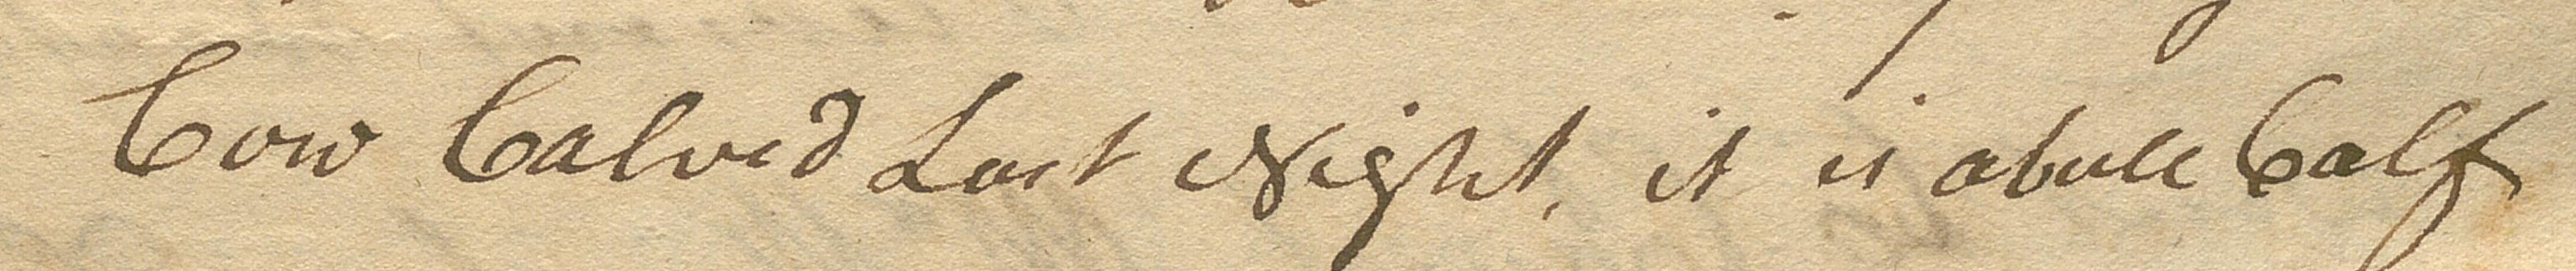Cow Calved Last Night it is a bull Calf
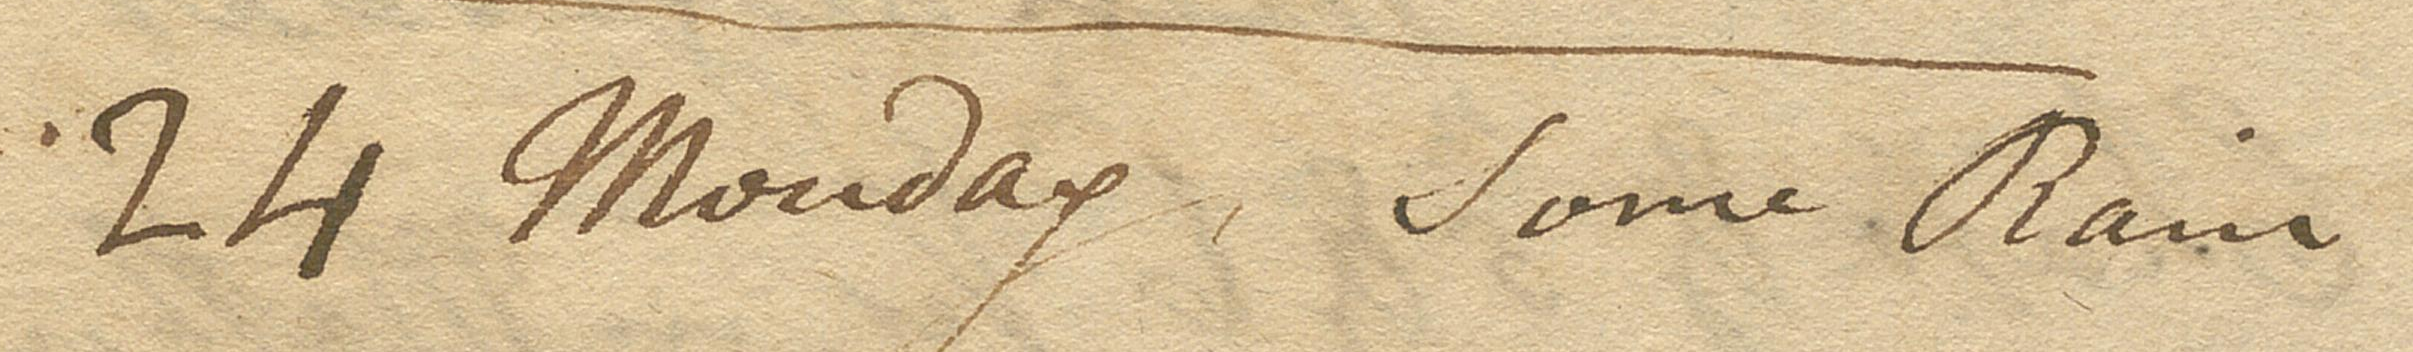24 Monday, some Rain
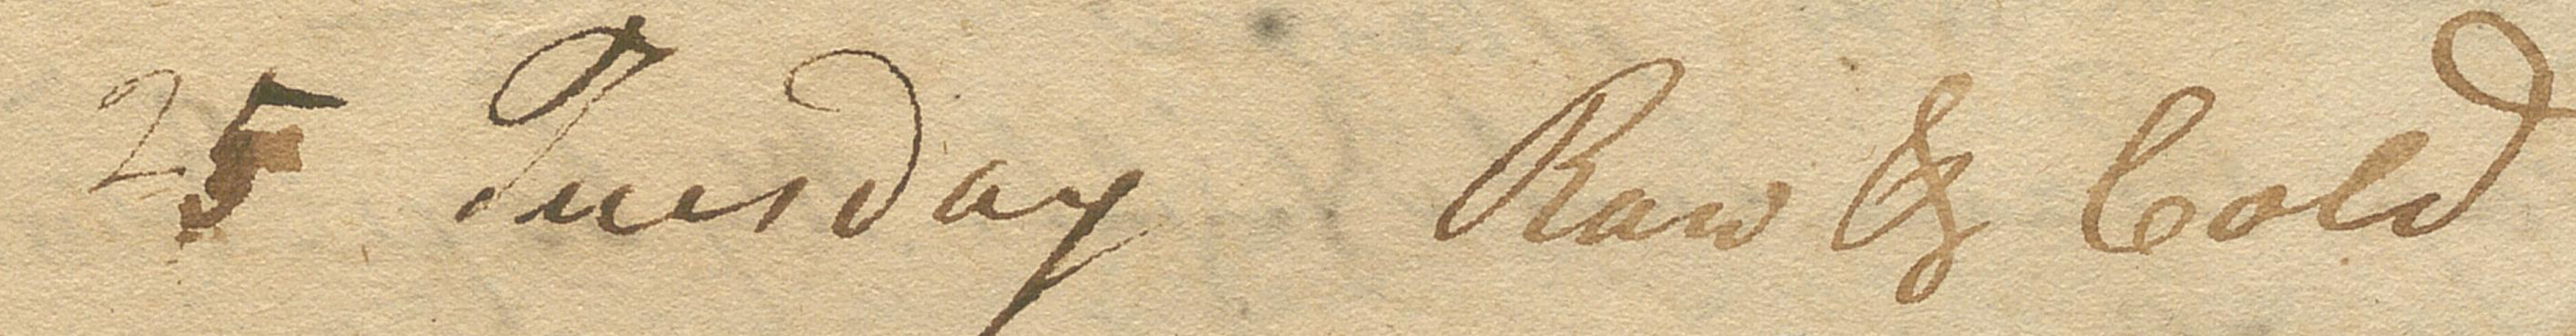25 Tuesday Raw & Cold
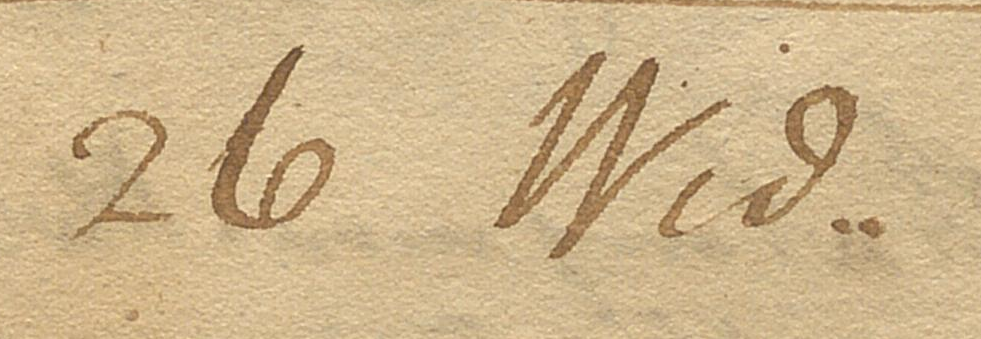26 Wed.
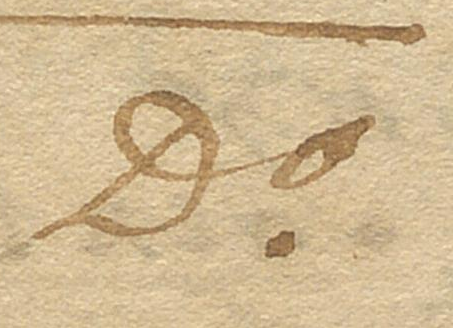D^o.
